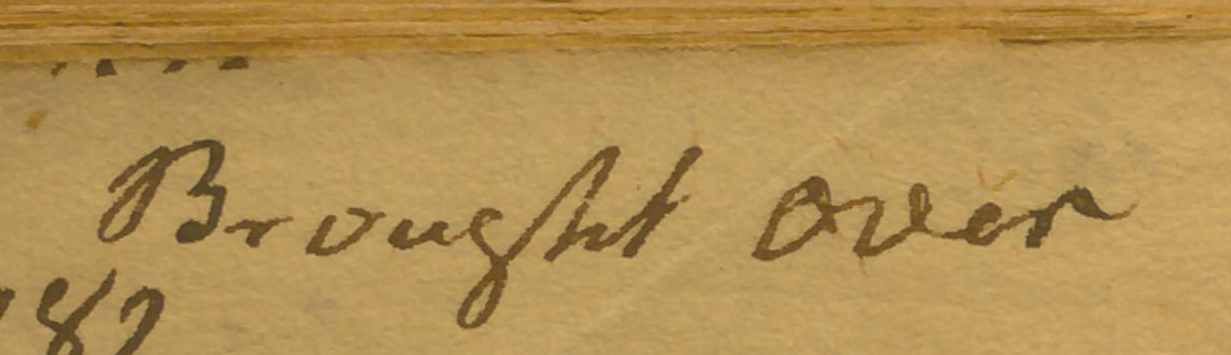Brought over
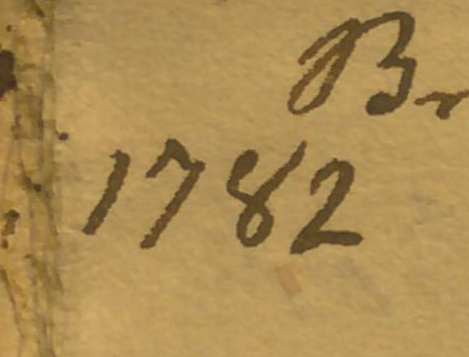1782
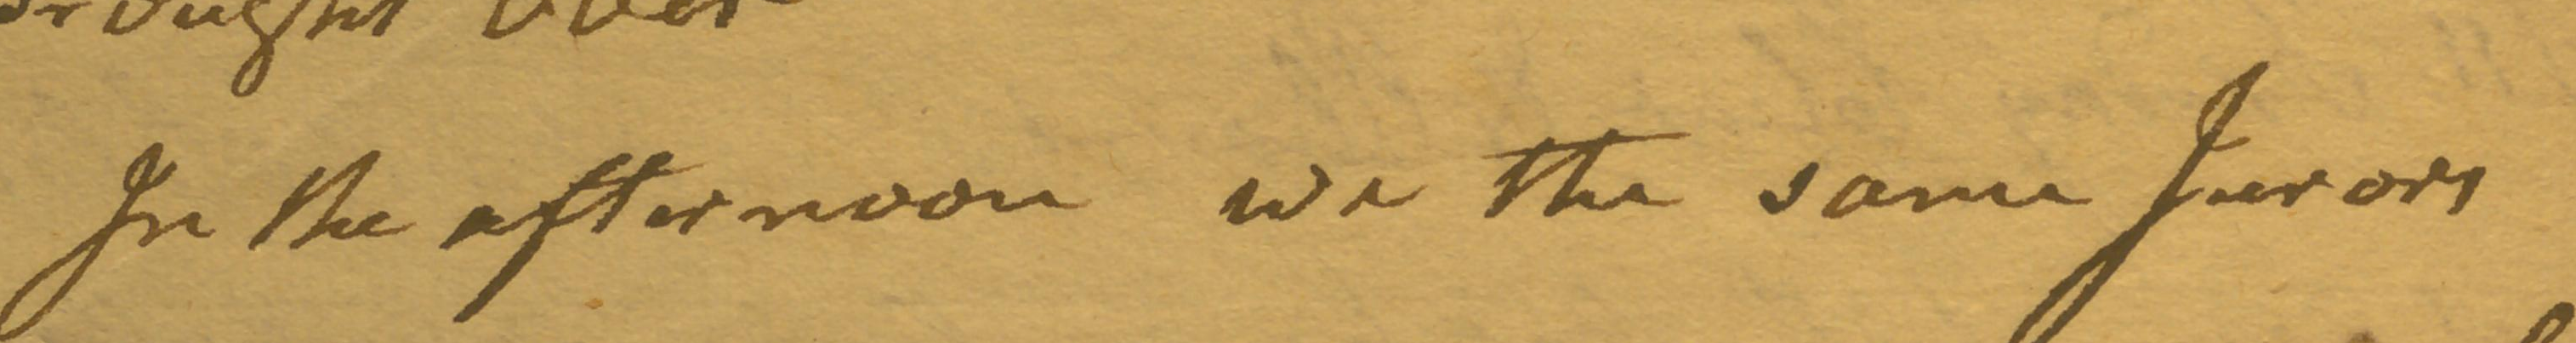In the afternoon we the same Jurors
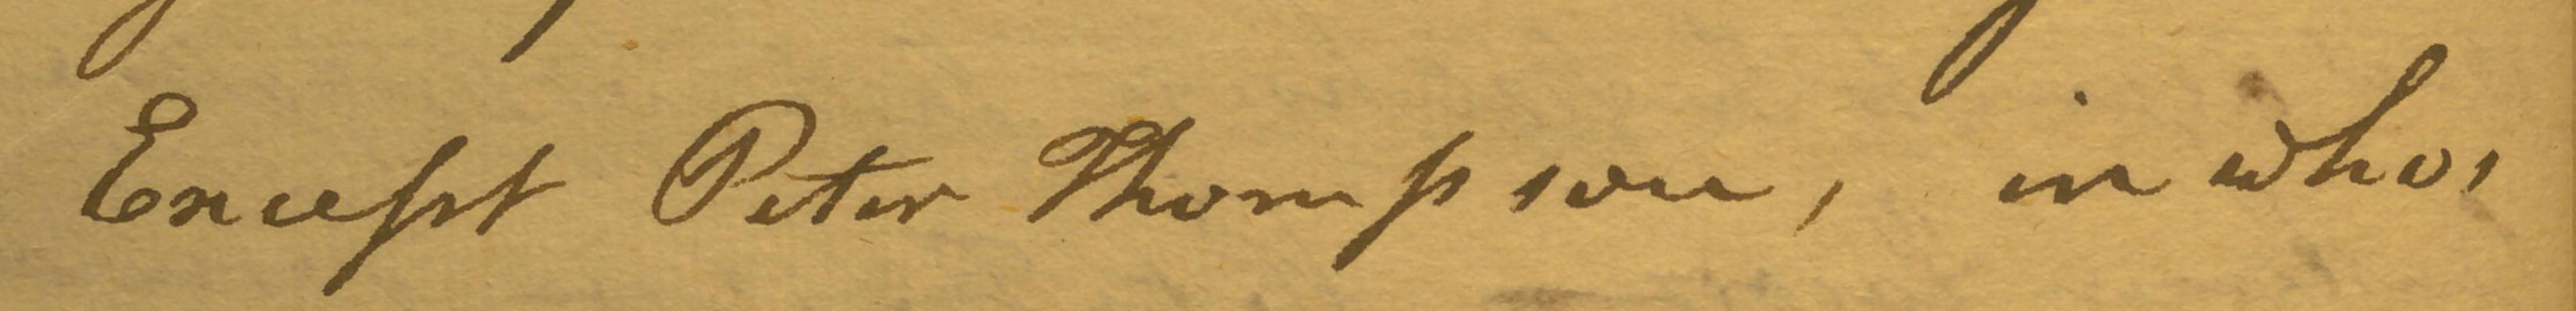Except Peter Thompson, in whos
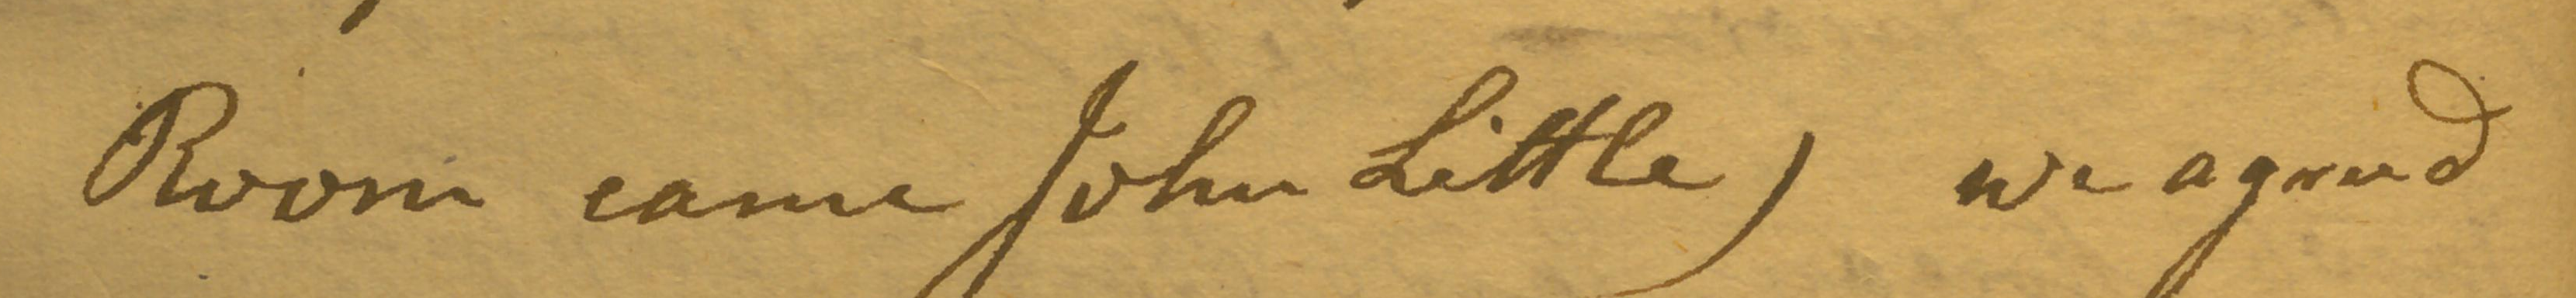Room came John Little, we agreed
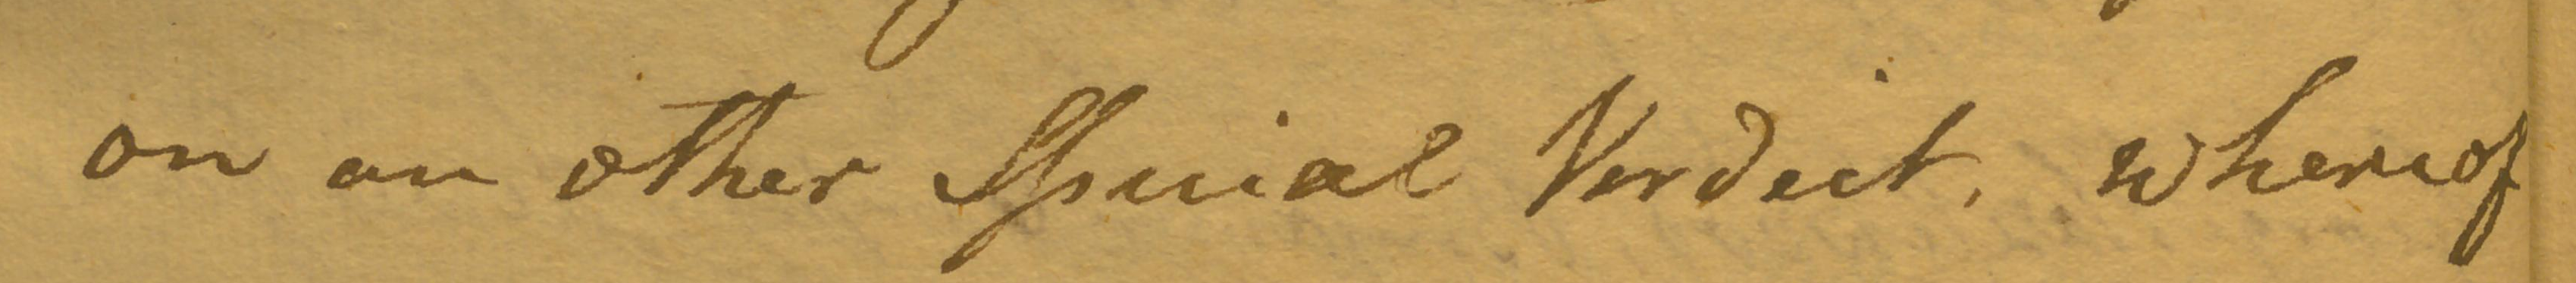on an other Special Verdict, whereof
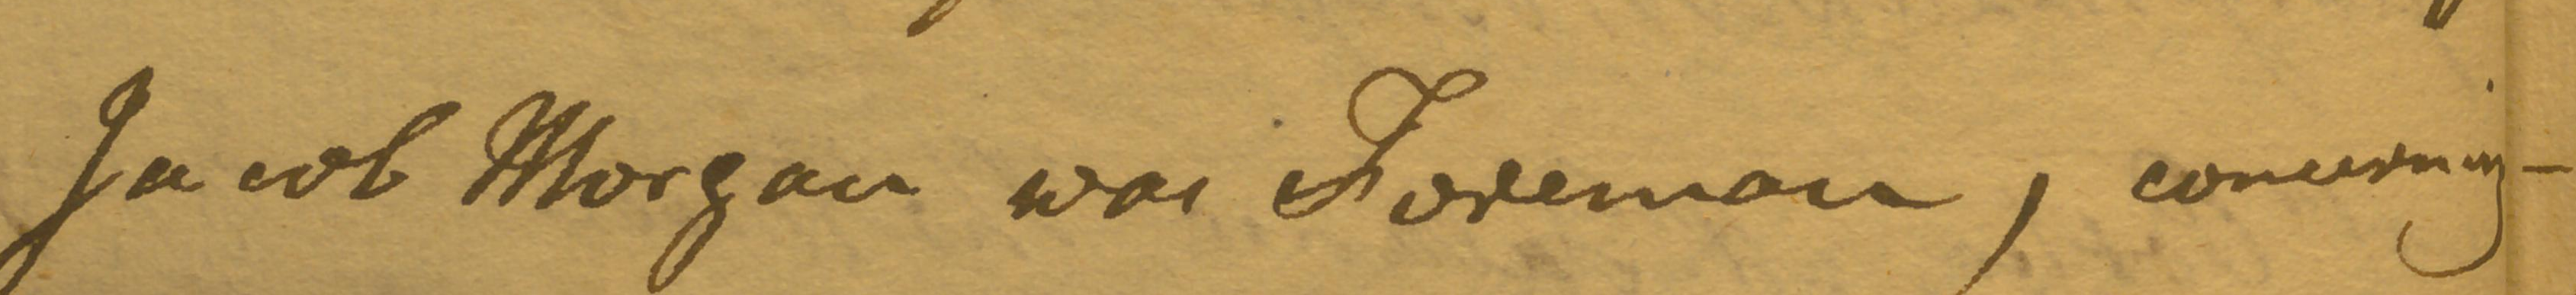Jacob Morgan was Foreman, concerning
